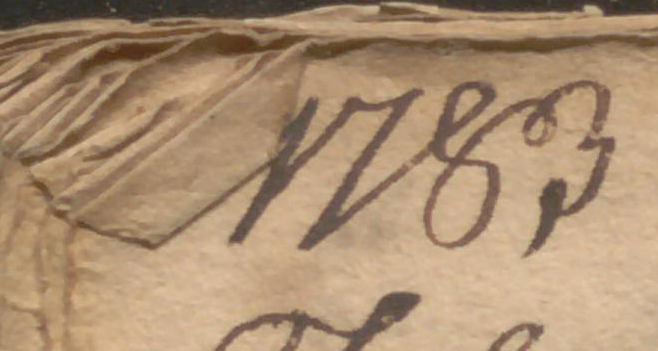1783
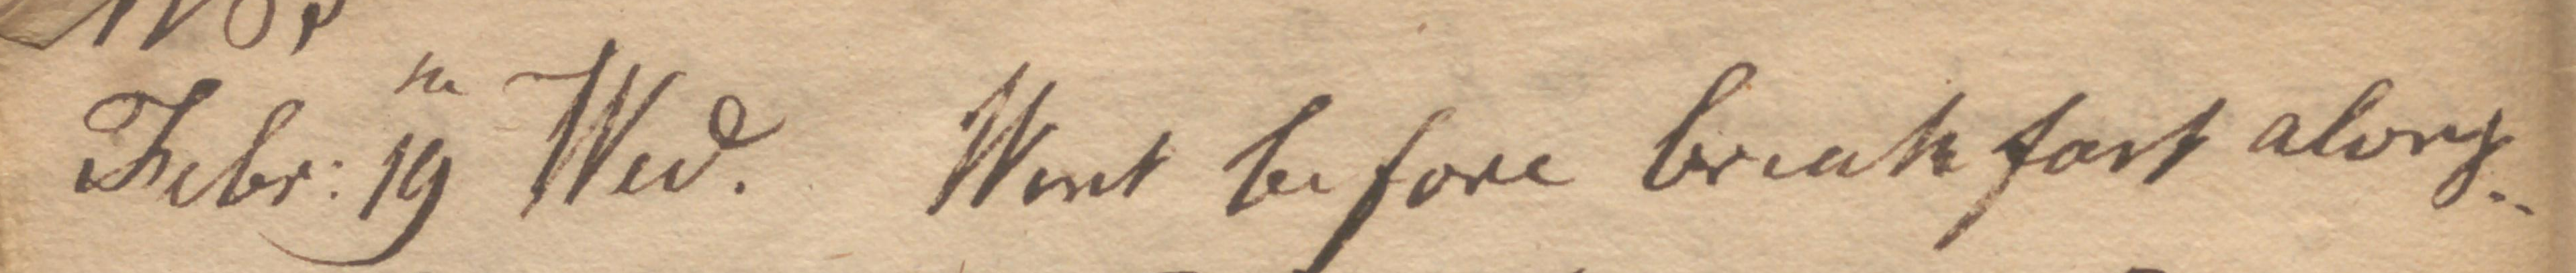Febr: 19^th Wed. Went before breakfast along
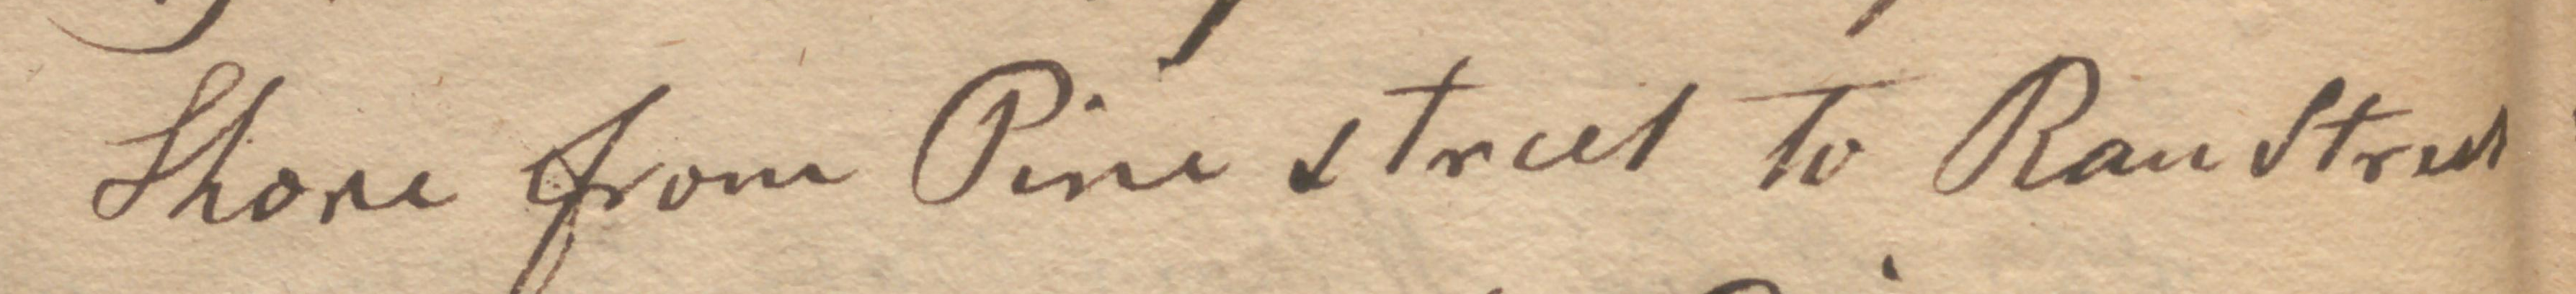Shore from Pine street to Race Street
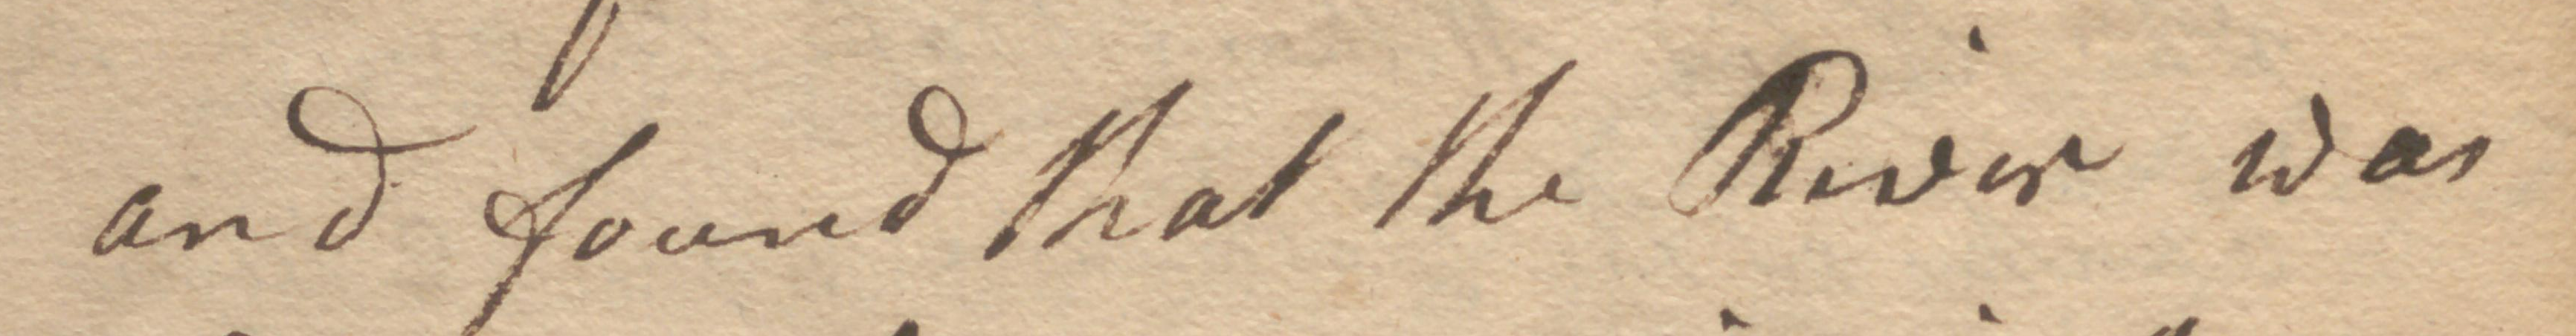and found that the River was
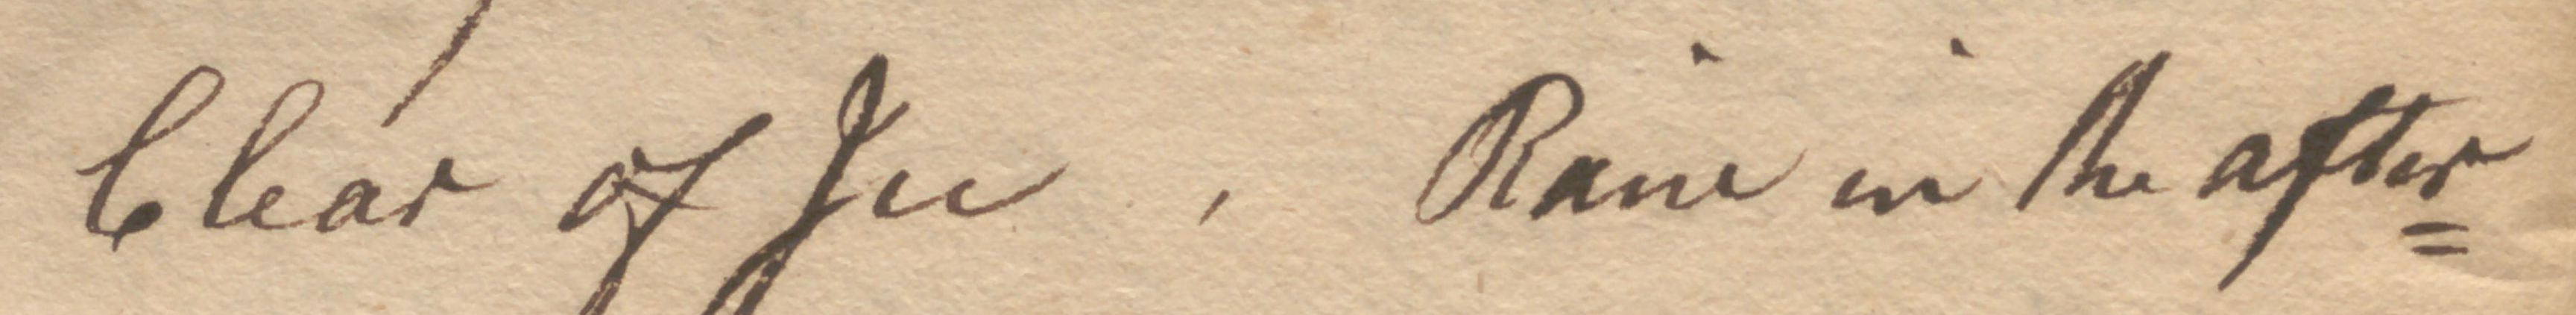Clear of Ice. Rain in the after
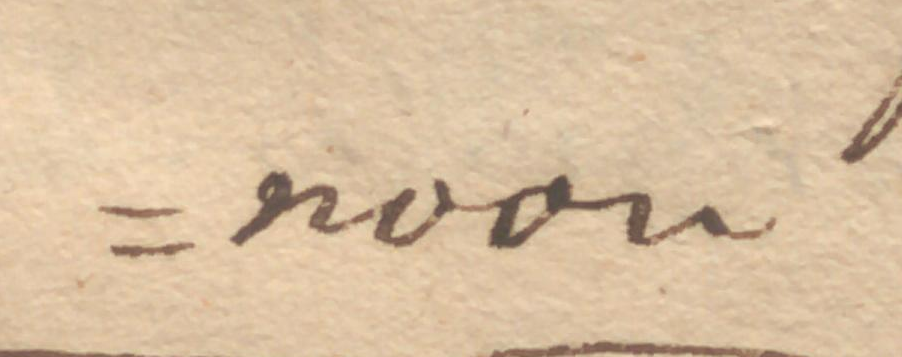-noon
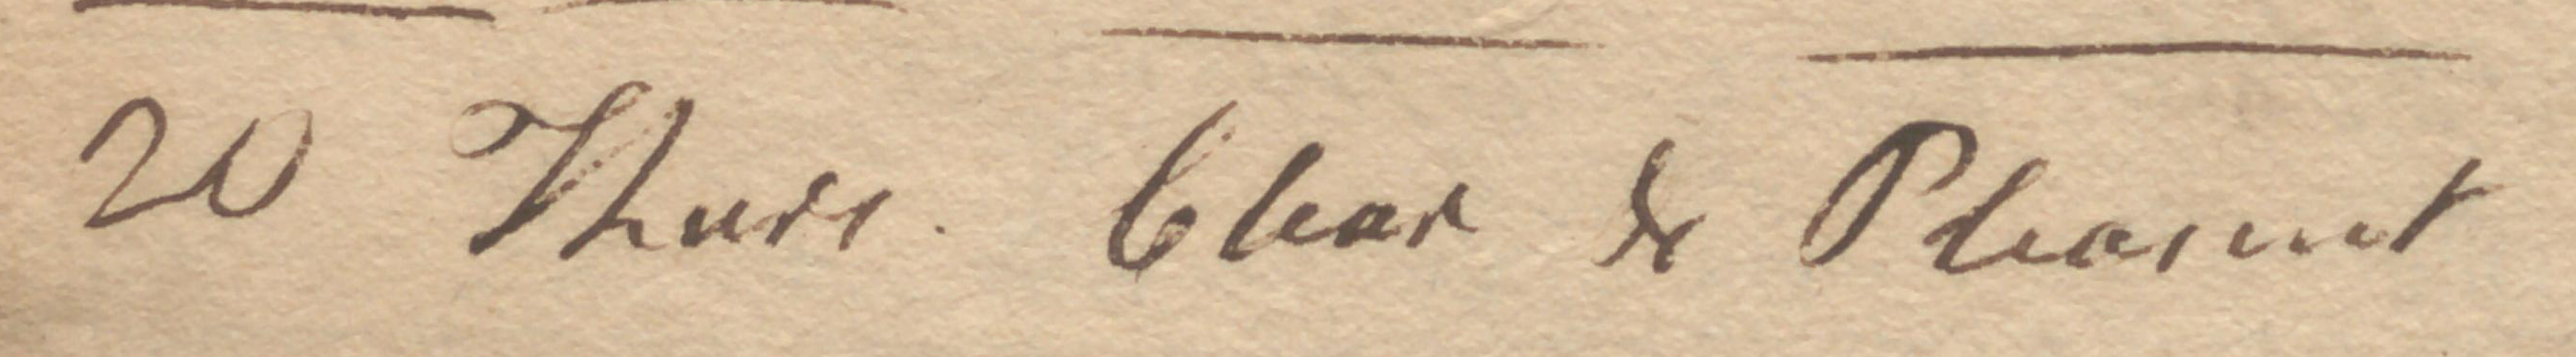20 Thurs. Clear & Pleasent
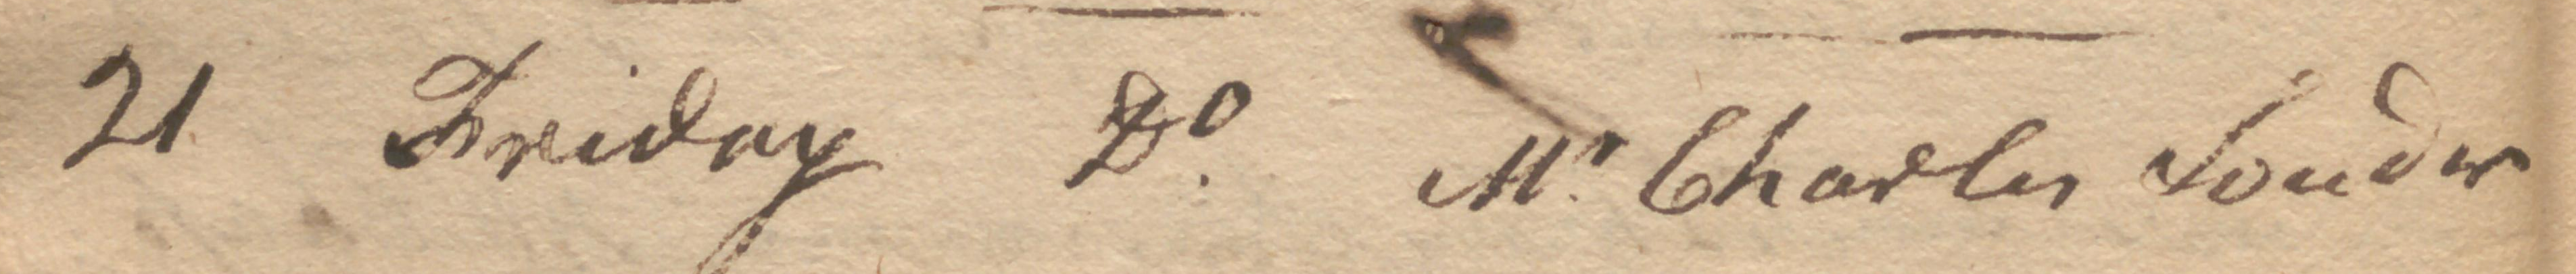21 Friday D^o. M^r. Charles Souder
